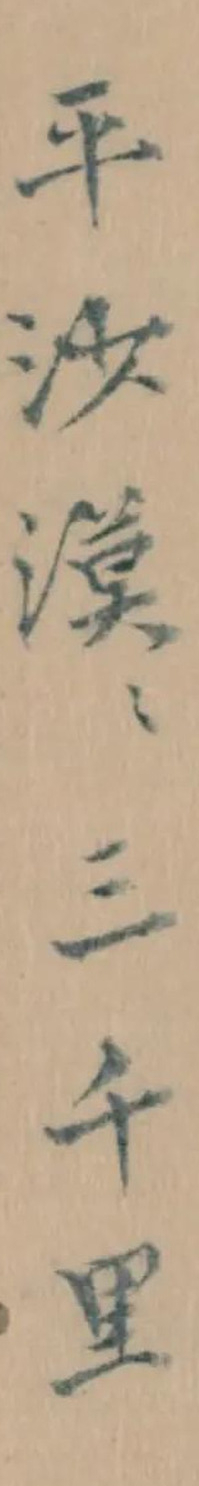平沙漠ニ？三千里
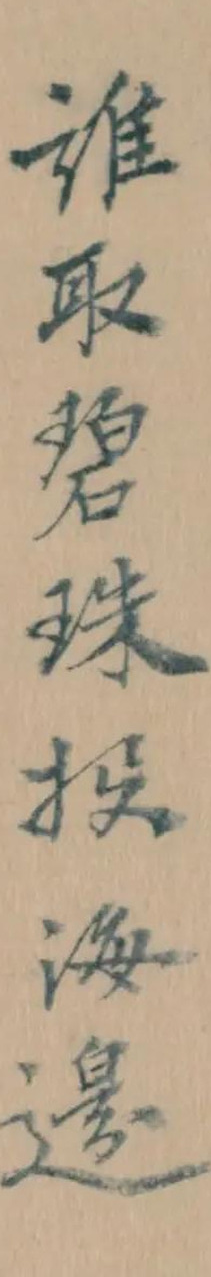誰取碧珠投海辺

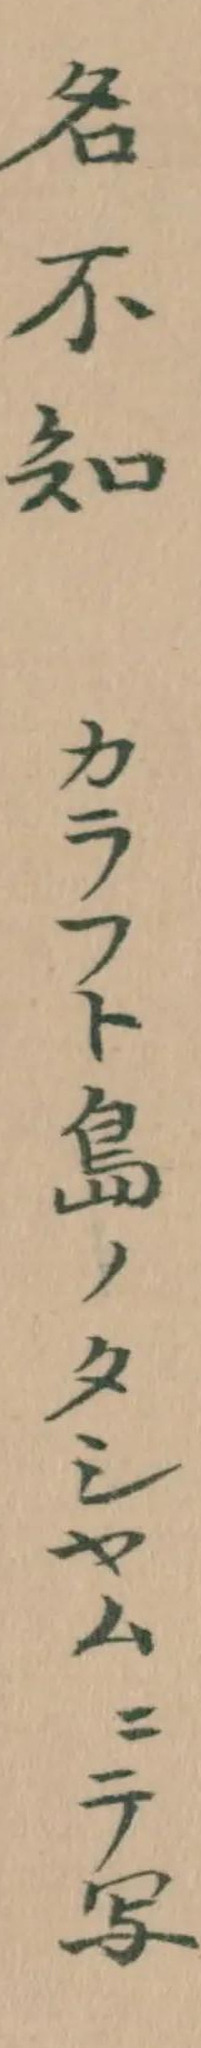名不知カラフト島ノタシヤムニテ写
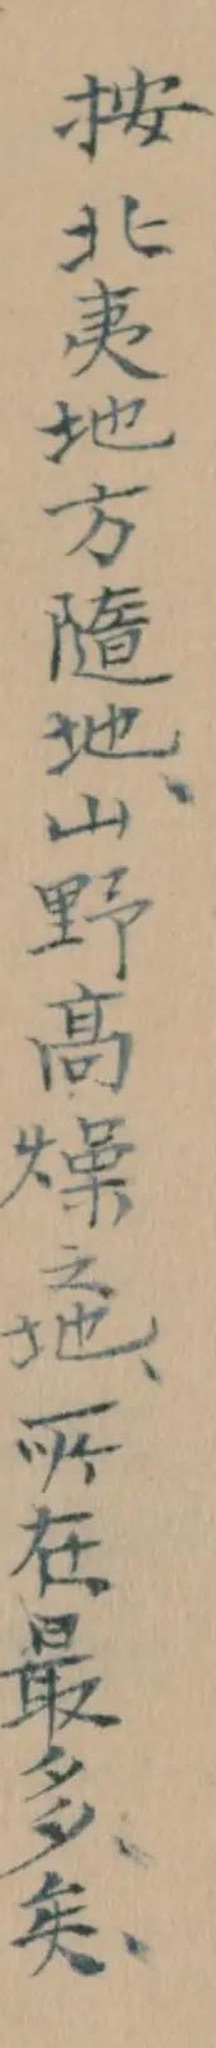按北夷地方隨地、山野高燥之地、所在最多矣、
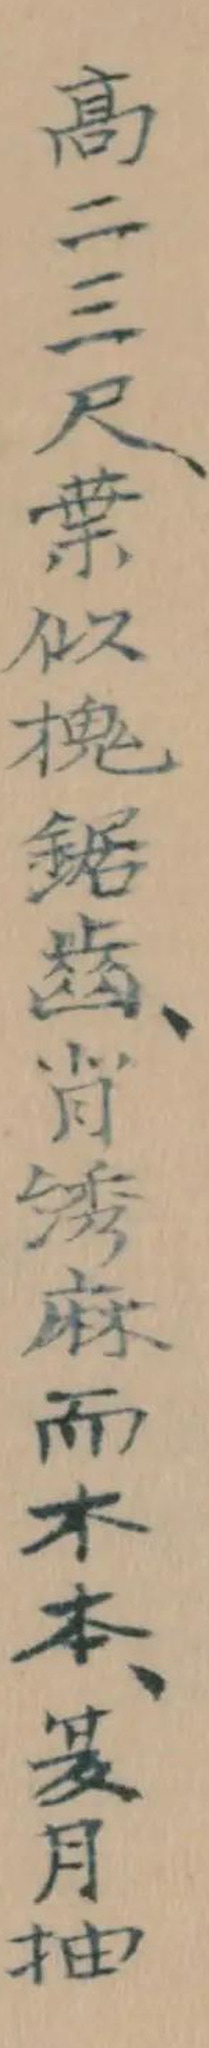高二三尺、葉似槐鋸歯、肖綉麻而木本、夏？月抻
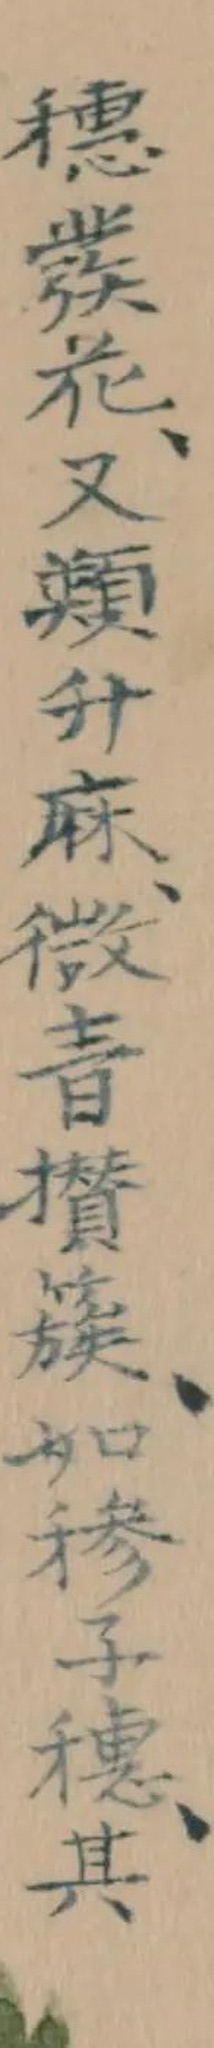穂穂発花、又類升麻、微青攅簇、如䅟子穂、其
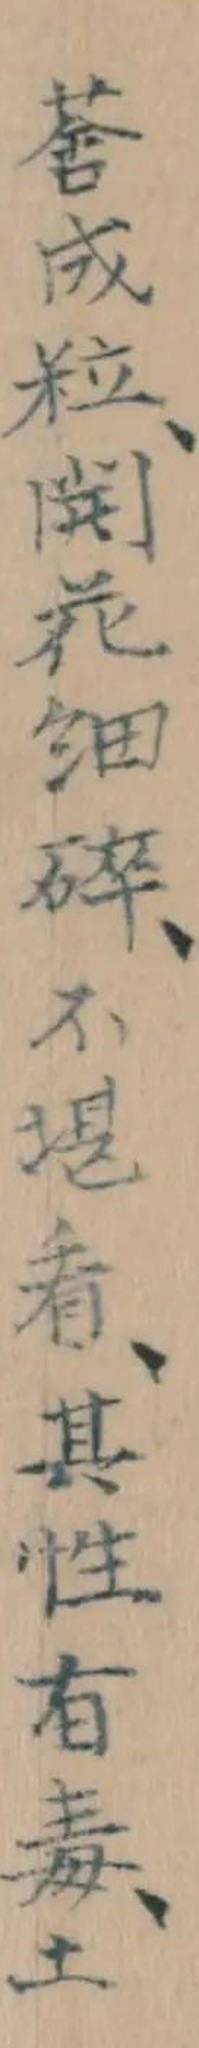莟？成粒、開花細砕、不堪看、其性有毒、土
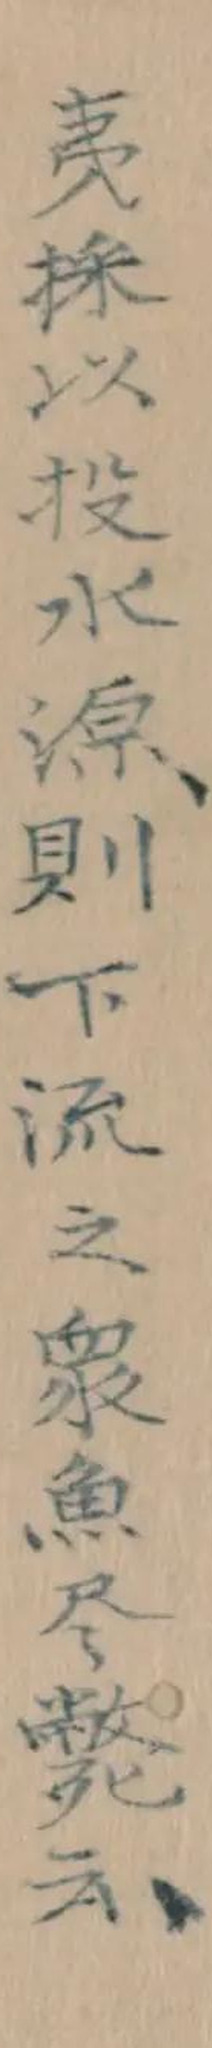夷採以投水源、則下流之衆魚尽薨云、
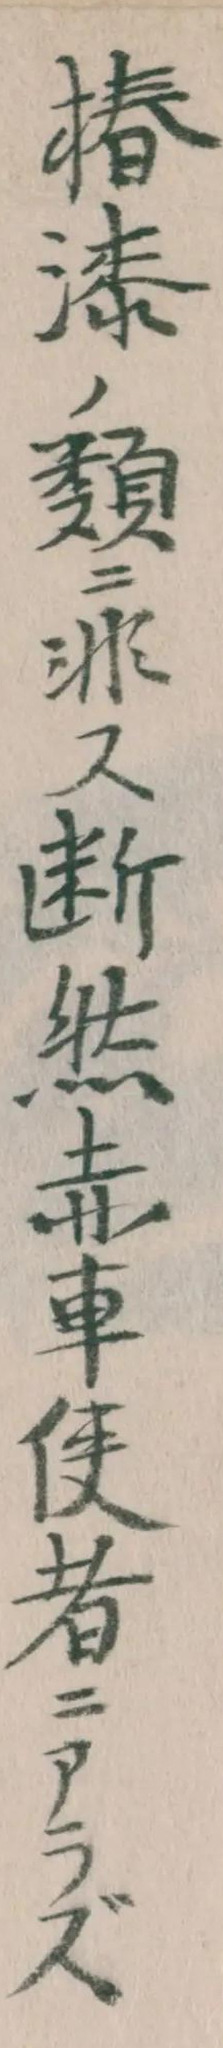椿漆ノ類ニ非ス断然赤車使者ニアラズ
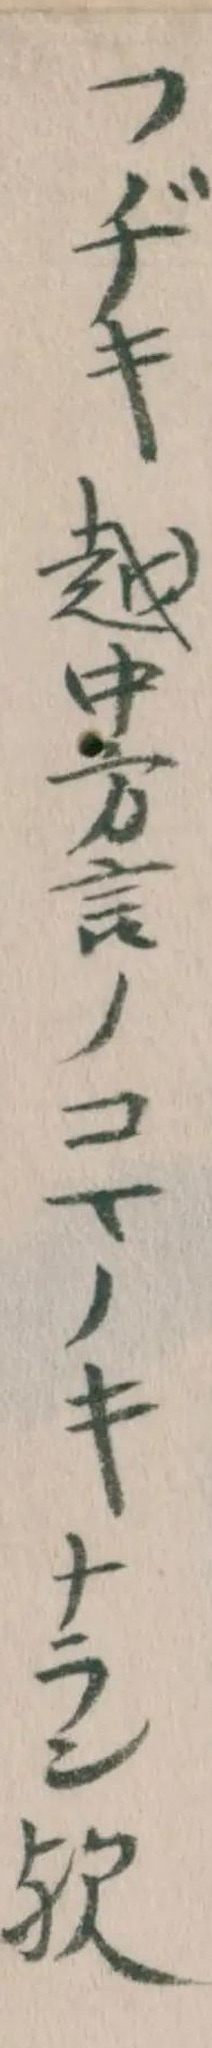フヂキ越中方言ノコマノキナラン歟

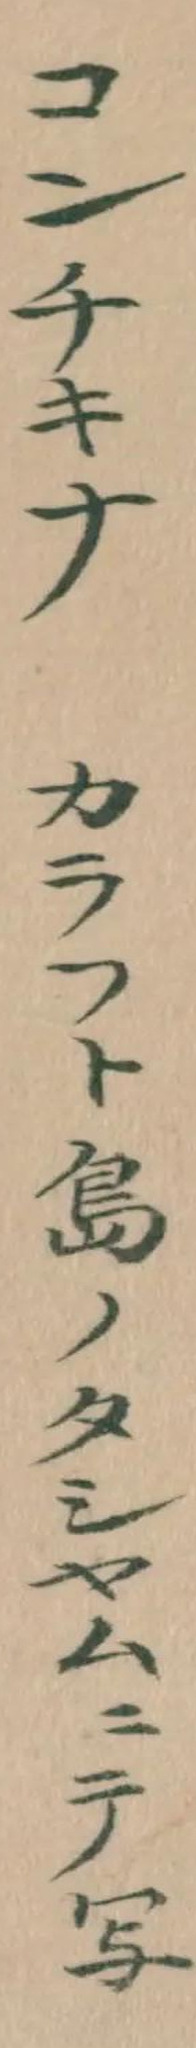コンチキナカラフト島ノタシヤムニテ写
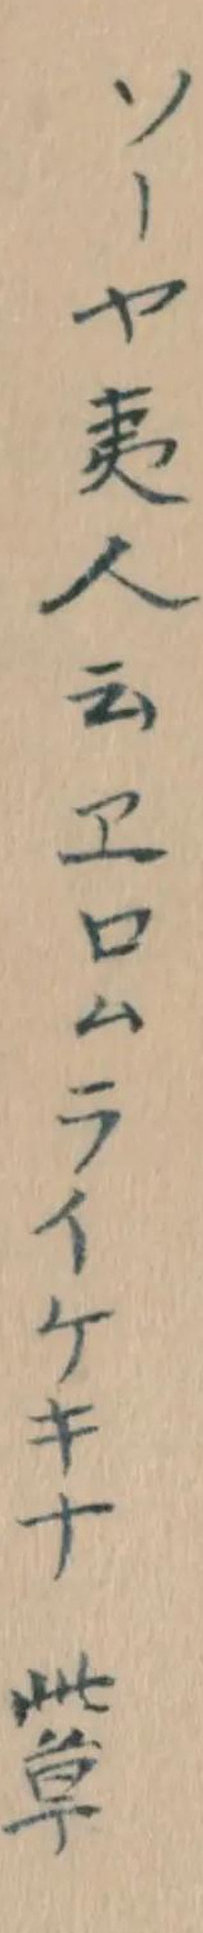ソーヤ夷人云ヱロムライケキナ此草
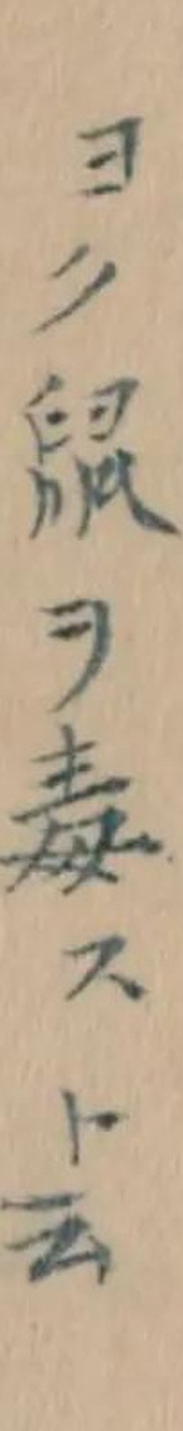ヨク鼠ヲ毒スト云
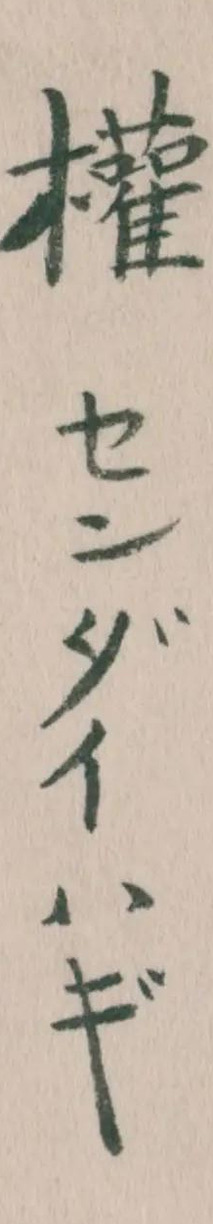権センダイハギ

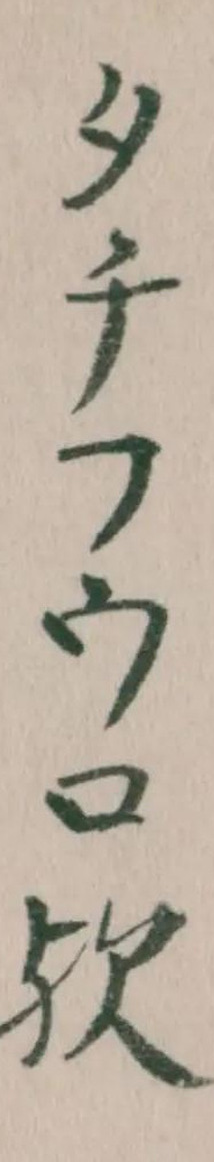タチフウロ歟
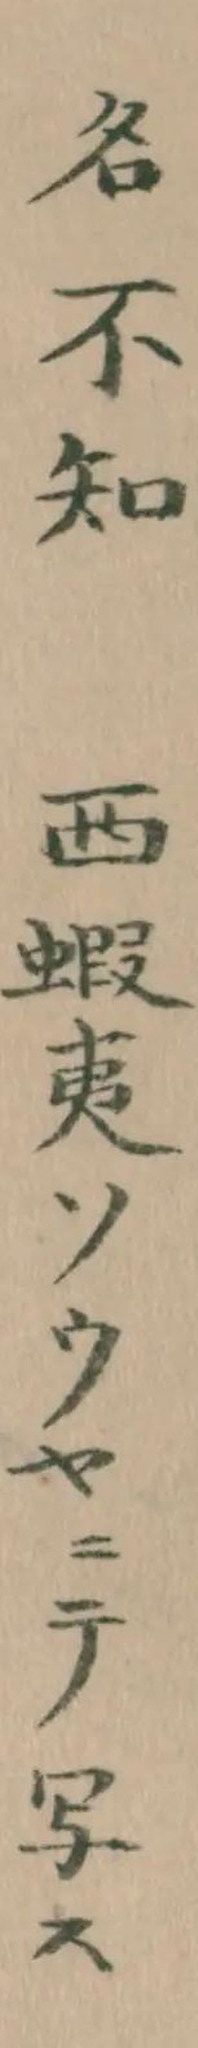名不知西蝦夷ソウヤニテ写ス
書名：蝦夷草木図
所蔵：国立国会図書館 National Diet Library, JAPAN
